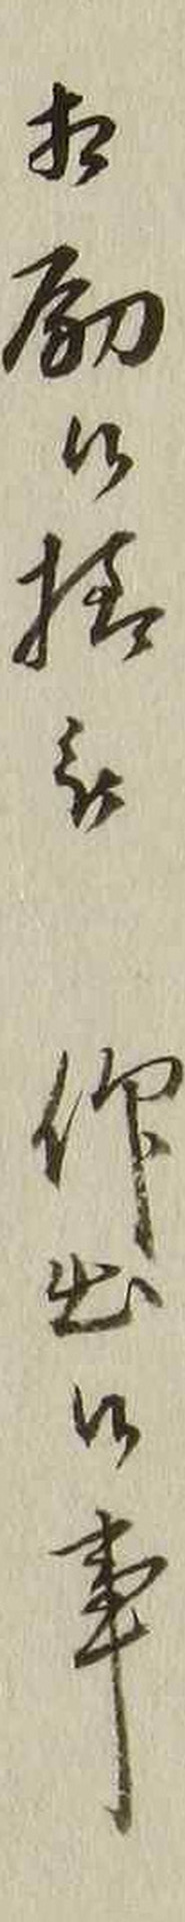相励候様被仰出候事
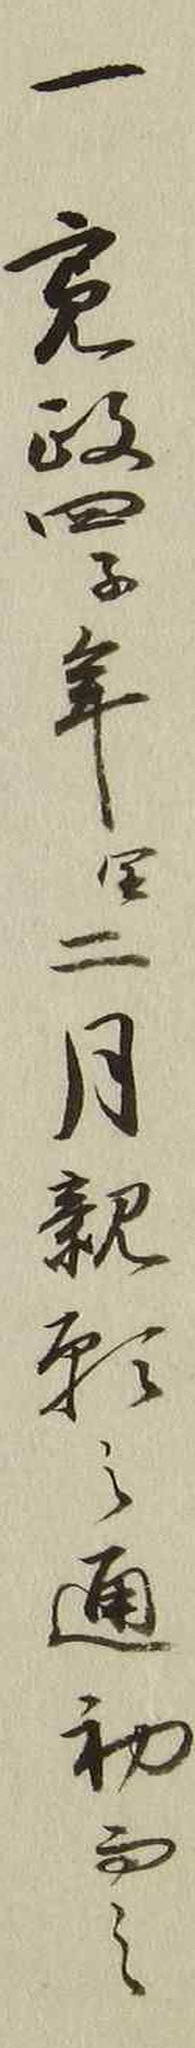一寛政四子年閏二月親願之通初而之
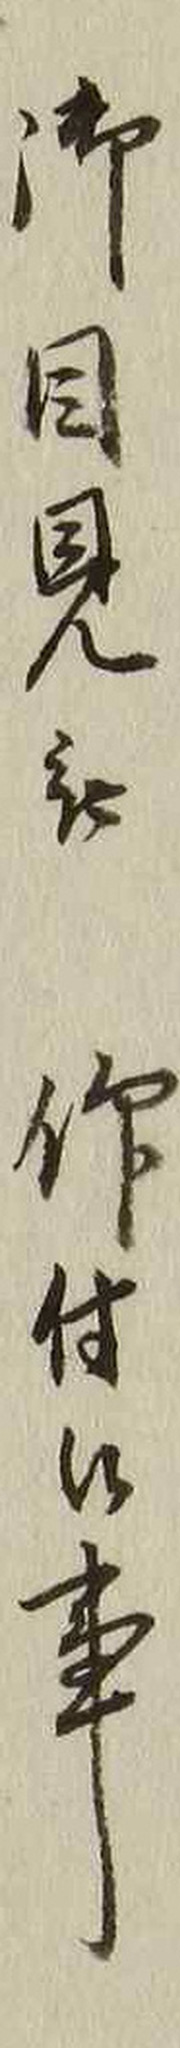御目見被仰付候事
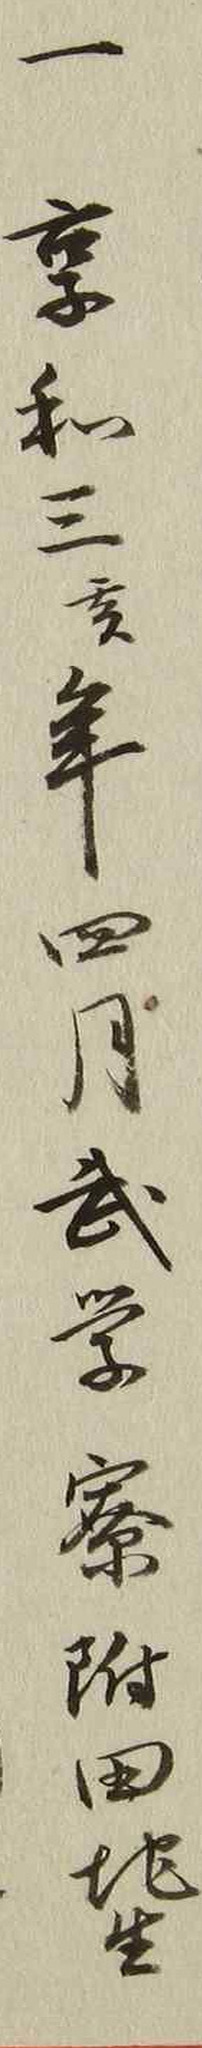一享和三亥年四月武学寮附田地生
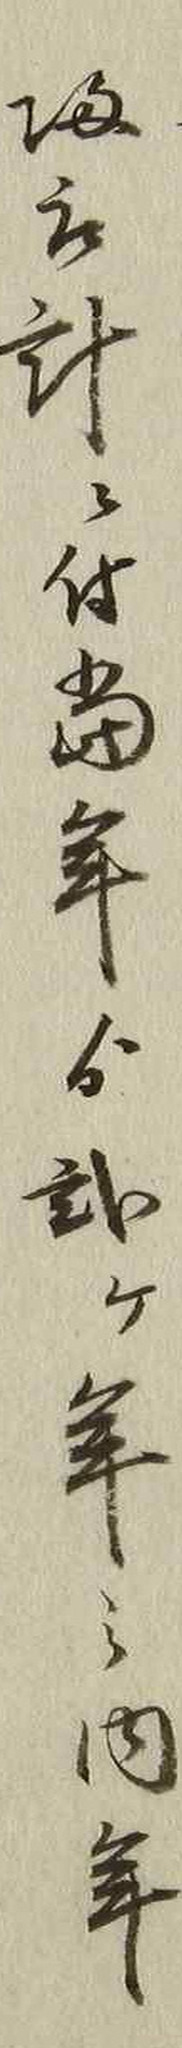帰取計ニ付当年ゟ弐ヶ年之内年
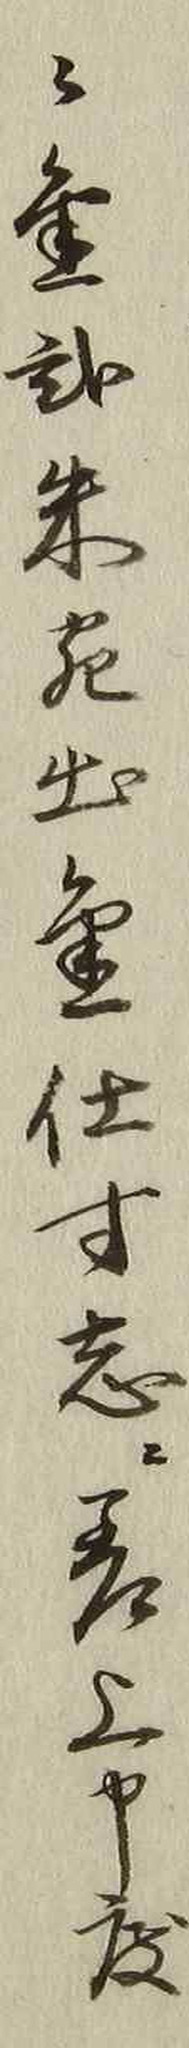々金弐朱宛出金仕寸志ニ差上申度
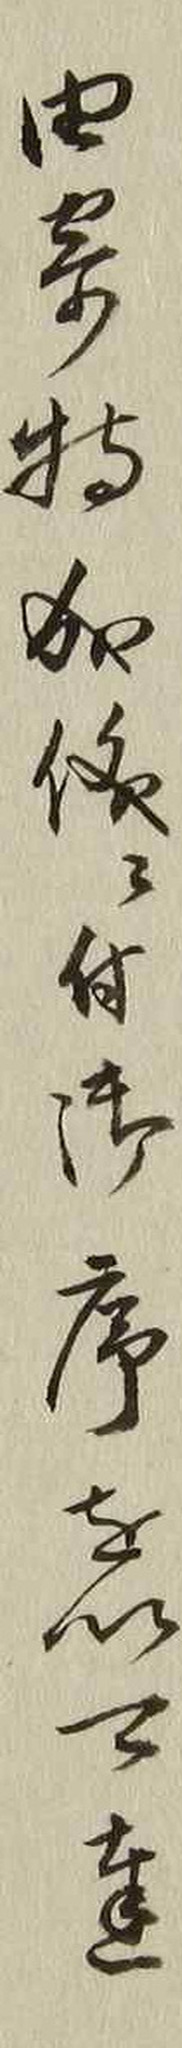由寄特成儀ニ付御序を以可達
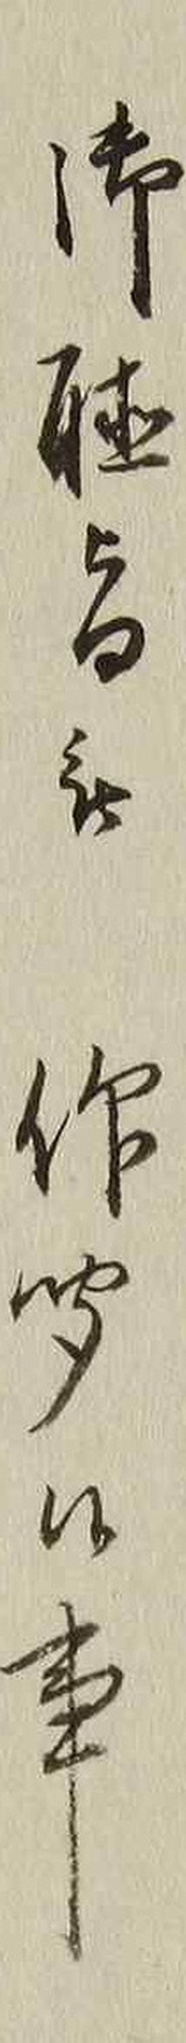御聴旨被仰聞候事
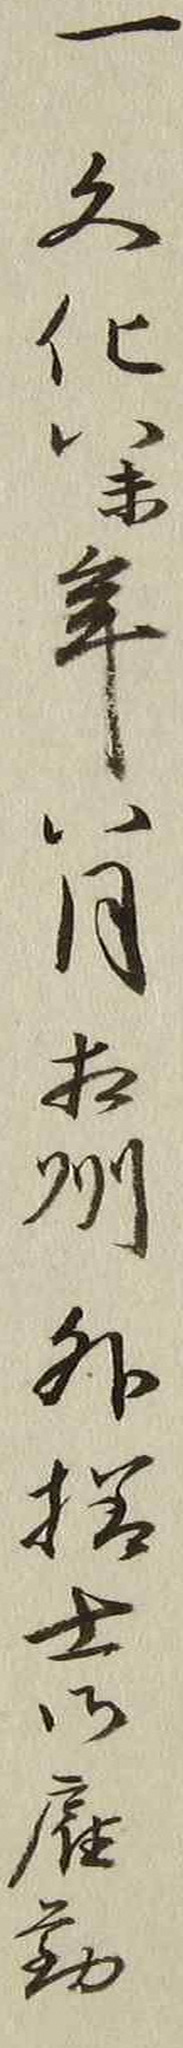一文化八未年八月相州外様士御雇勤
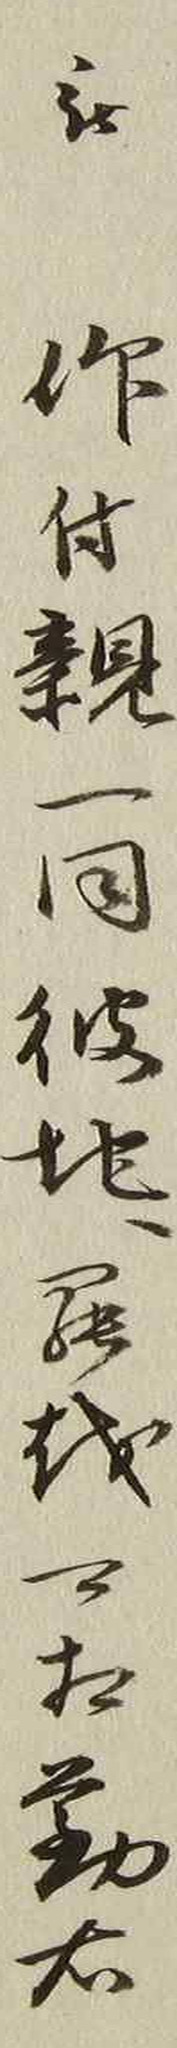被仰付親一同彼地へ罷越可相勤右
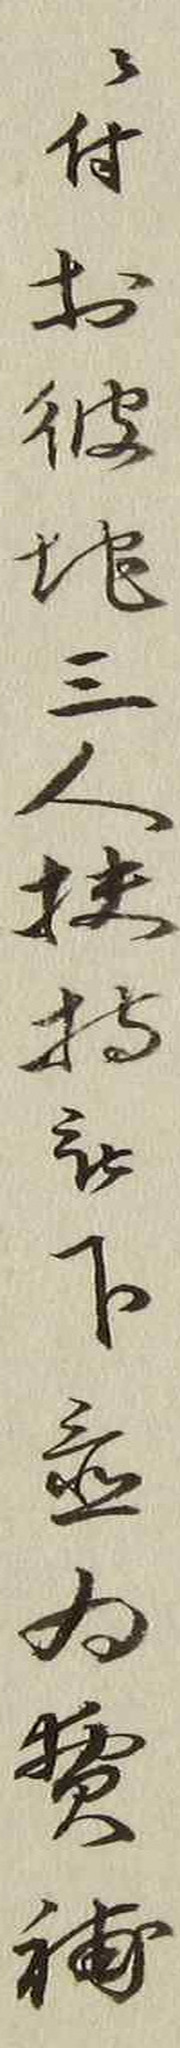ニ付於彼地三人扶持被下置為費補
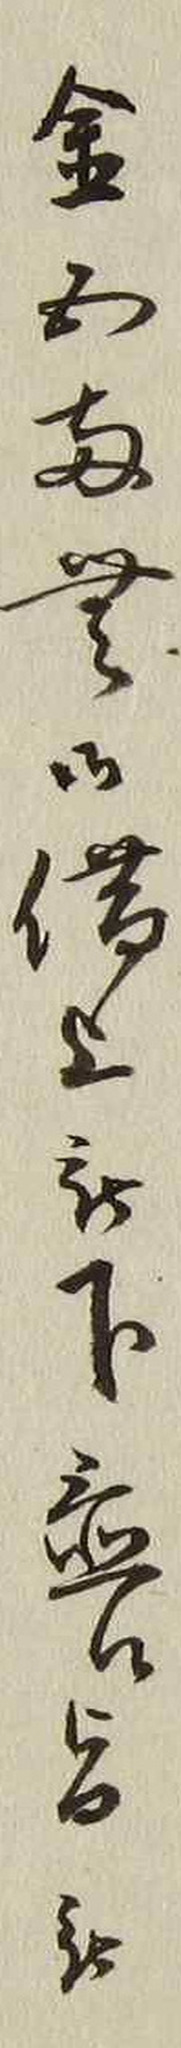金五両無御借上被下置候旨被
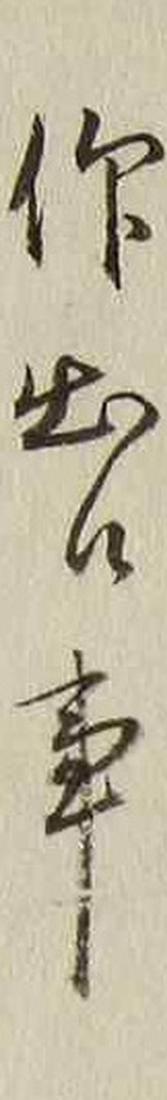仰出候事
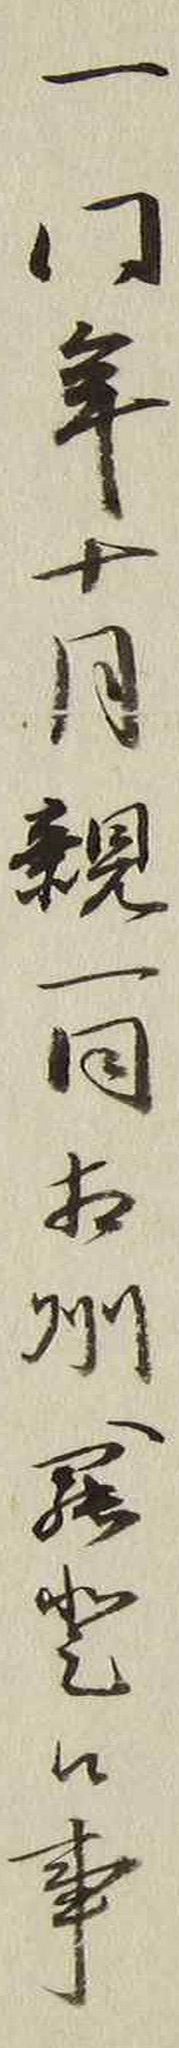一同年十月親一同相州へ罷登候事
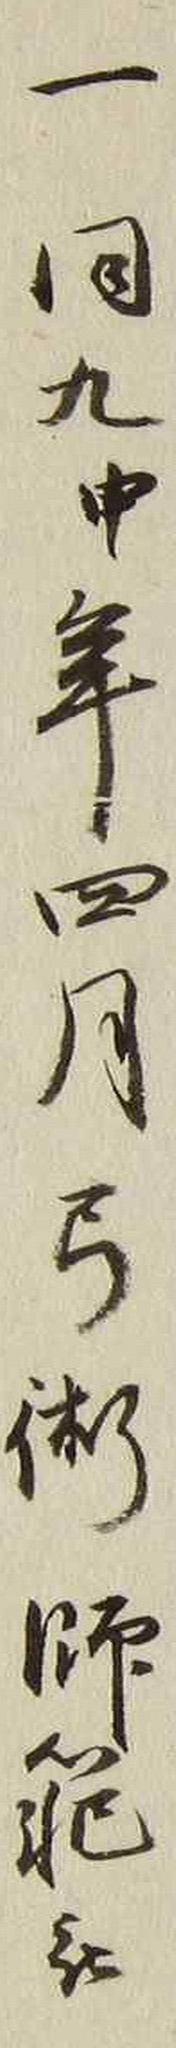一同九申年四月弓術師範被
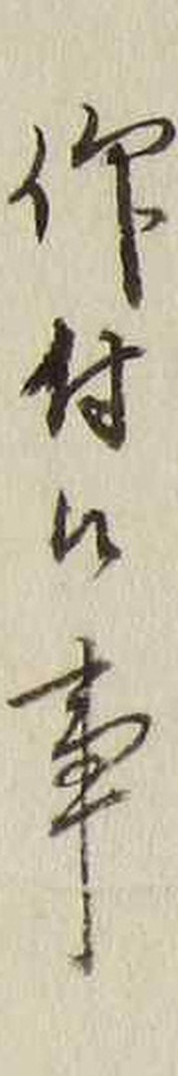仰付候事
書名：諸士系譜　巻之128　た之部4
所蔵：会津若松市立会津図書館
